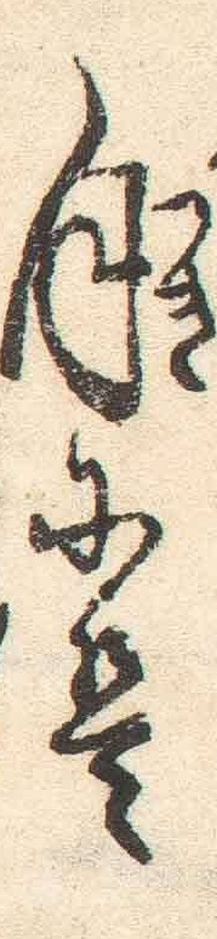月には
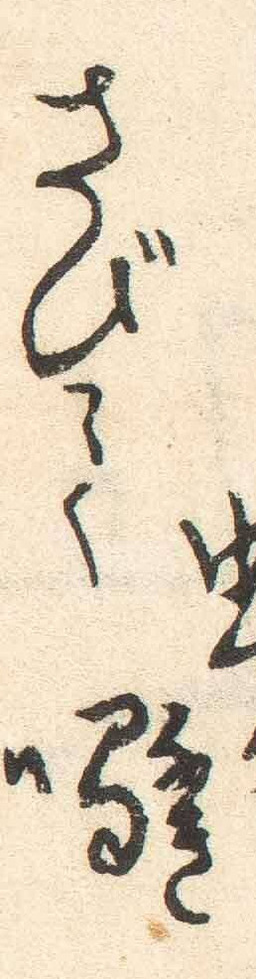さびて鳴
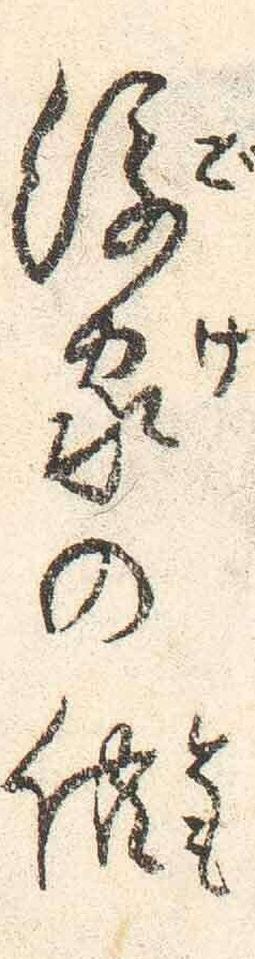後家の供
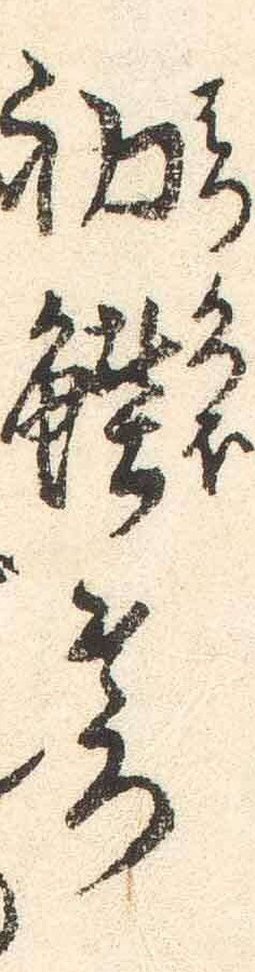初鰹そろ
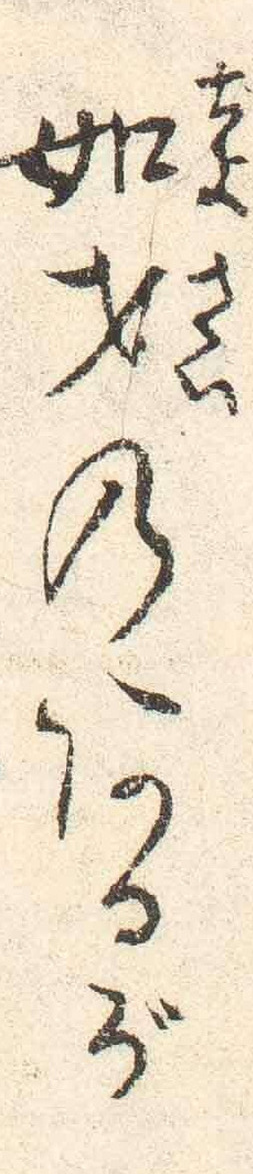如才のあるが
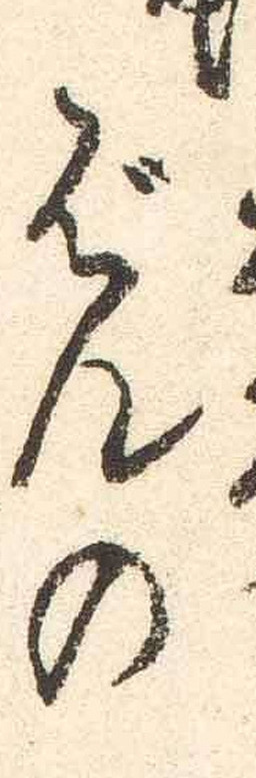ばんの
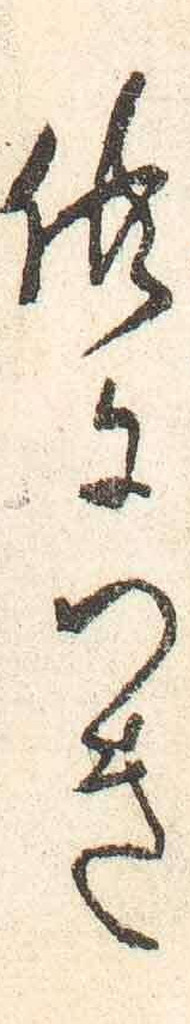供につき
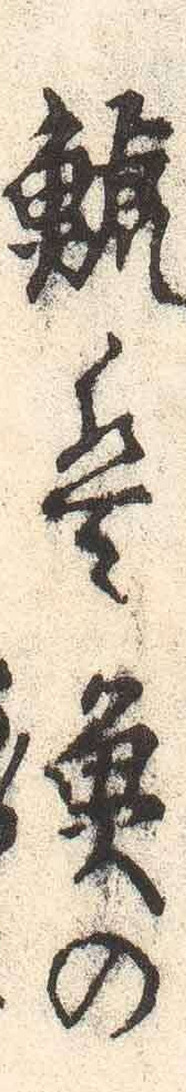鯱は魚の
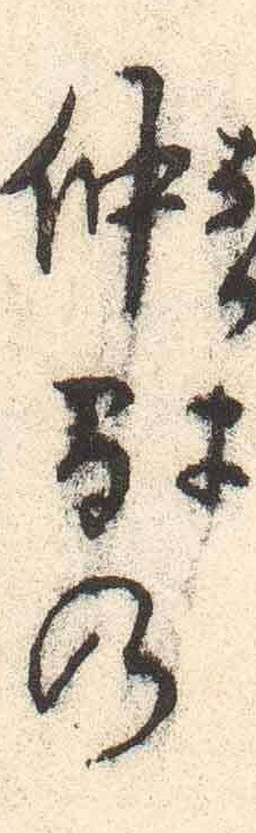仲間の
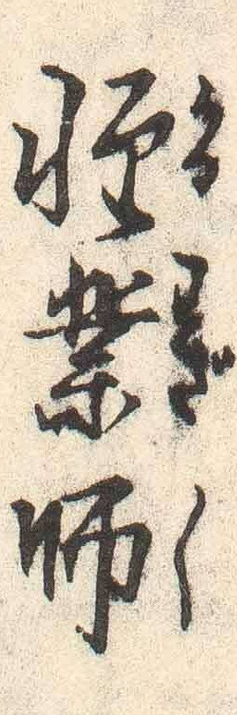軽業師
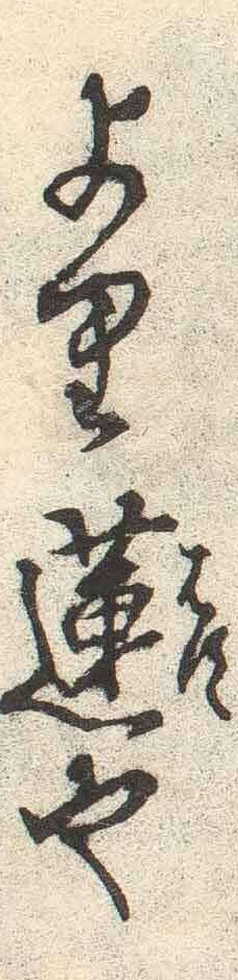より蓮や
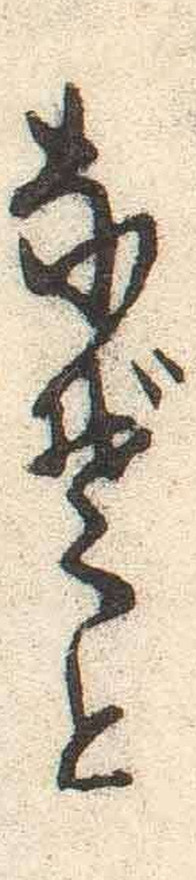なぞと
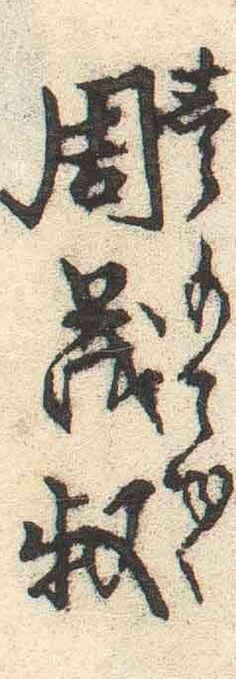周茂叔

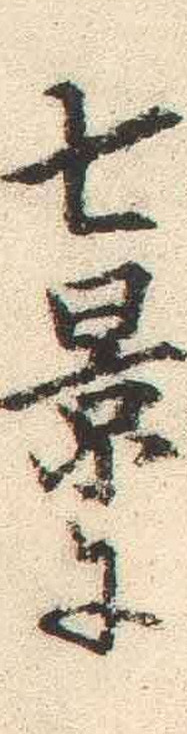七景に
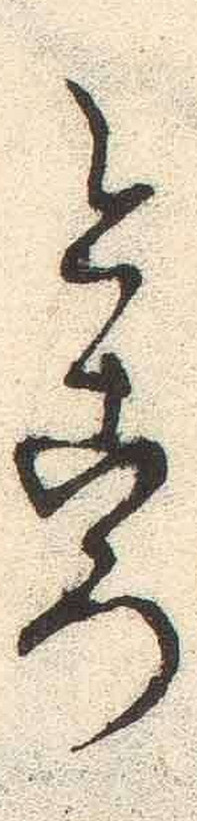ところ
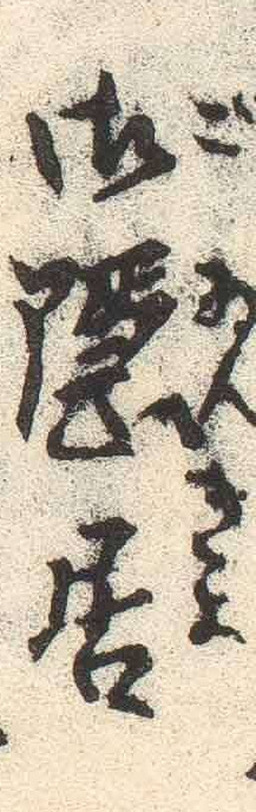御隠居
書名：画本柳樽
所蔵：東京学芸大学附属図書館 国文学研究資料館
